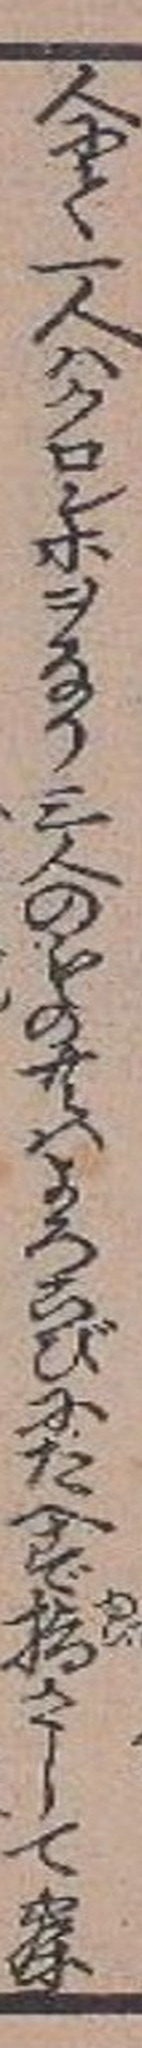人にて一人はクロンホヲなり三人のもの共はよろこびにたへず指さして寝
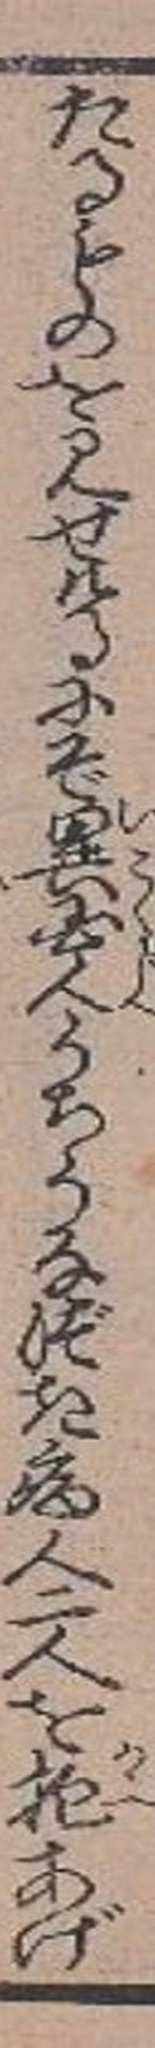たるものを見せけるにぞ異国人うちうなづき病人二人を抱あげ
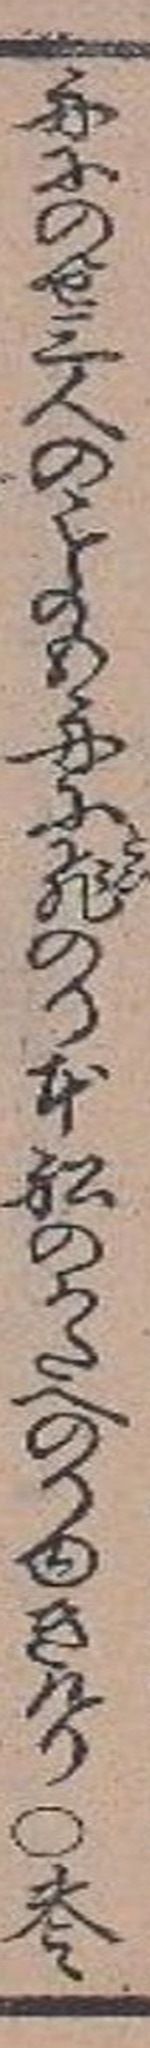舟にのせ三人のものも舟に飛のり本船のかたへのりゆきけり○夫よ
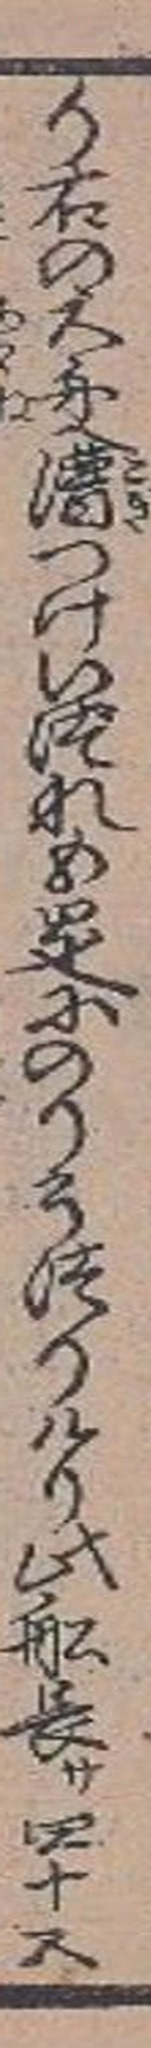り右の大舟へ漕つけいづれも是にのりうつりけり此船長さ四十五
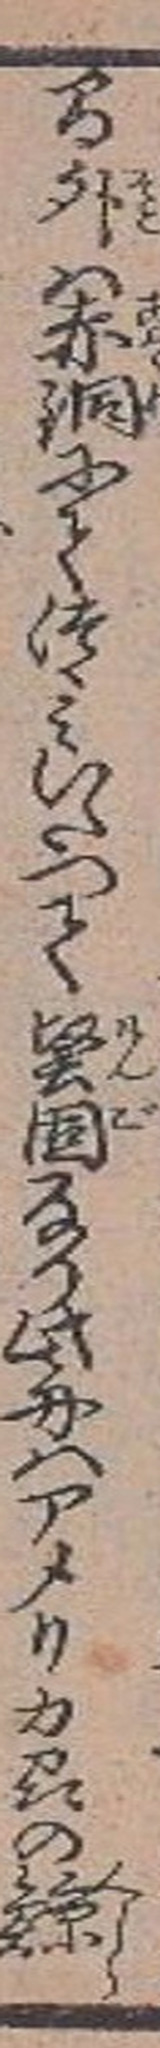間外は赤銅にてつゝみいたつて堅固なり此舟はアメリカ州の鯨
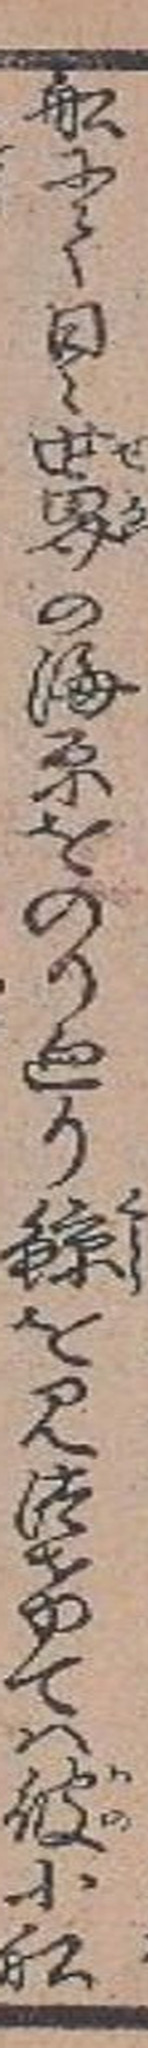船にて日々世界の海原をのり廻り鯨を見つけては彼小船
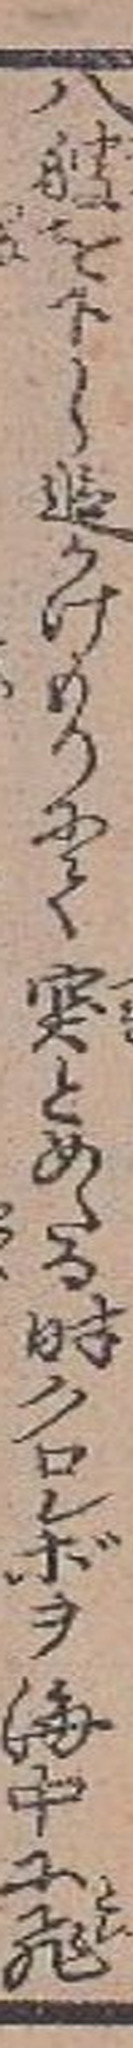八艘を下し追かけもりにて突とめたる時クロンボヲ海中に飛
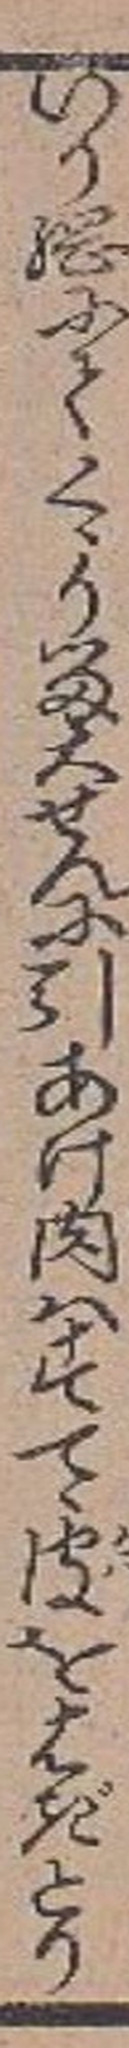いり綱にてくゝり留大せんに引あけ肉はすてゝ皮をはぎとり
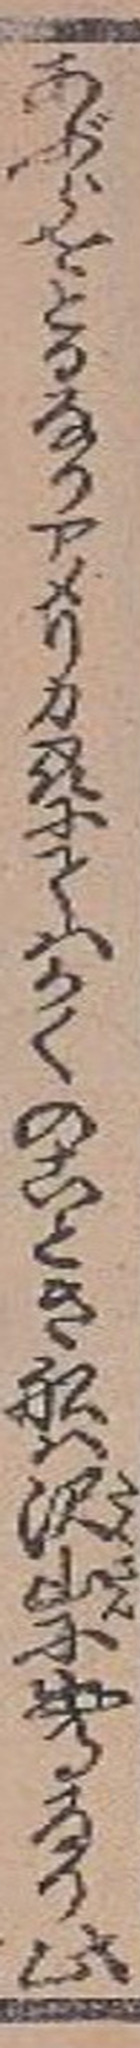あぶらをとるなりアメリカ州にてはかくのことき船は沢山に出？るなり此
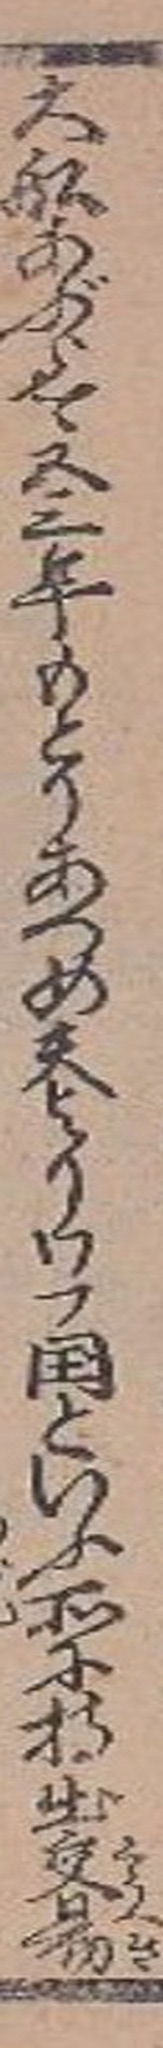大船あぶらを五三年もとりあつめ夫よりワフ国といふ所に持出交易
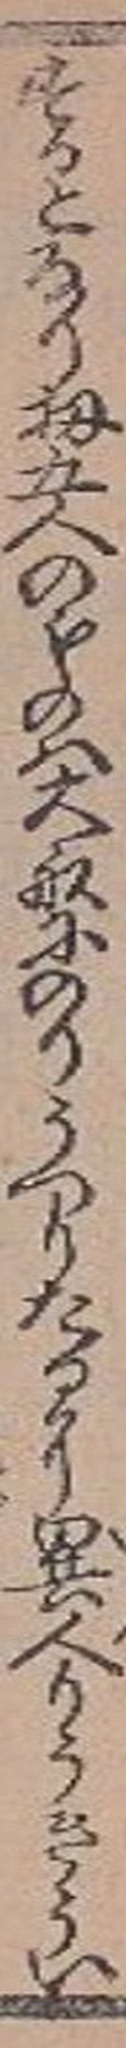するとなり扨五人のものは大船にのりうつりたるに異人りうきうい
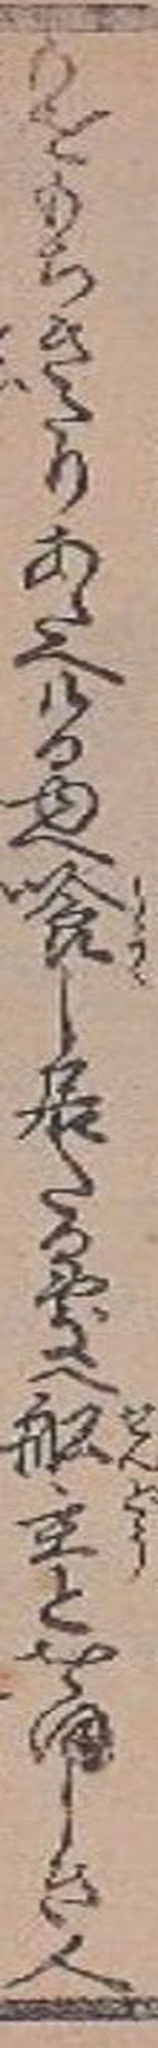りをもちきたりあたへけるゆへ喰し居たる処へ船主とをほしき人
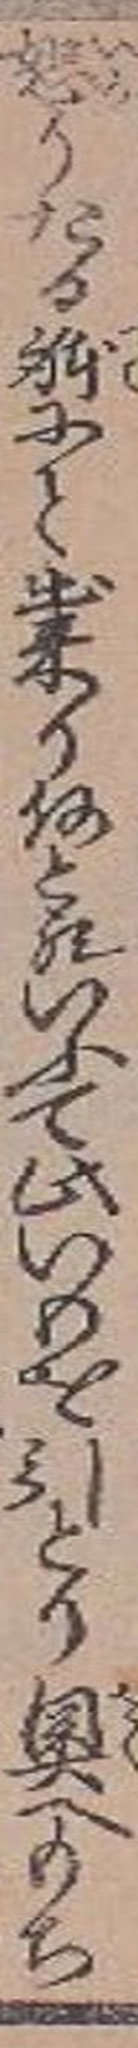怒りたる躰にて出来り何とかいふて此いもを引とり奥へもち
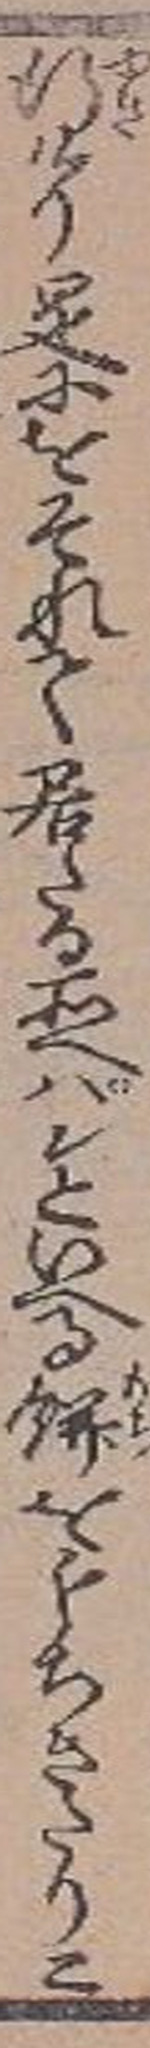行けり是にをそれて居たる所へパンといへる餅をもちきたりこ
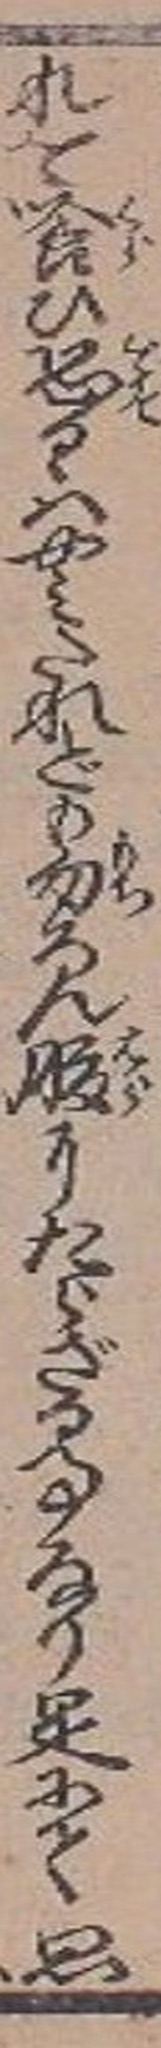れを喰ひ恐るゝはやみたれども勿ろん腹にたらざる事なり是にて思
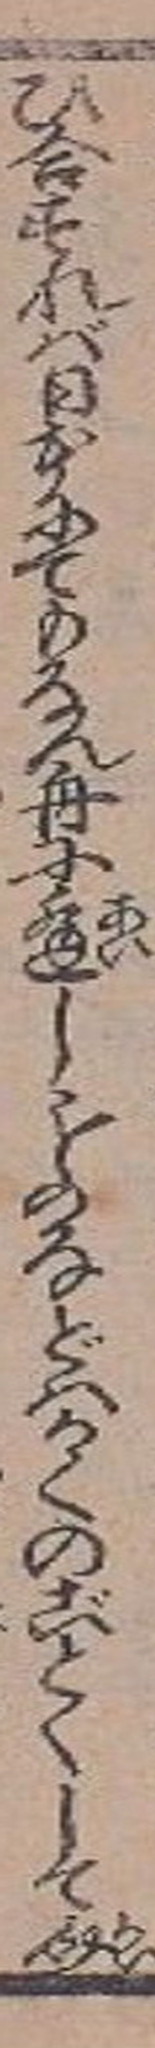ひ合すれば日本にてもなん舟に逢しものなどはかくのごとくして介
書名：満次郎漂流記
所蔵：University of the Ryukyus Library
